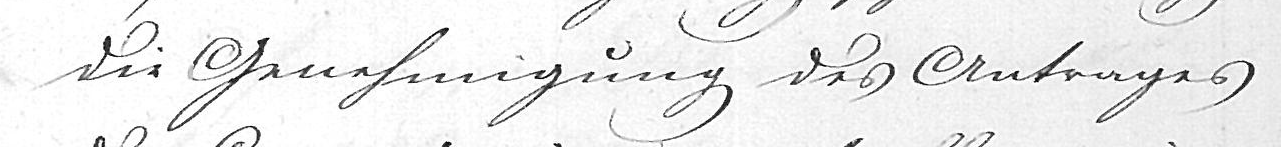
die Genehmigung des Antrages
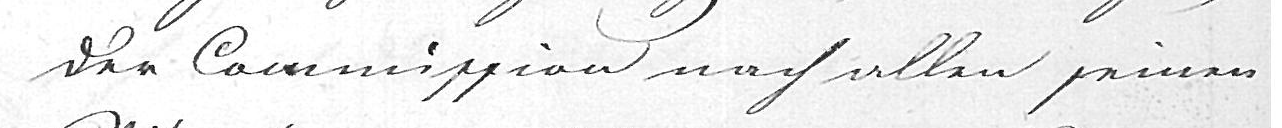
der Commission nach allen seinen
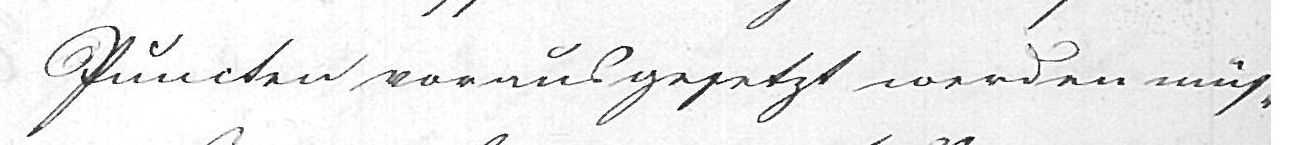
Puncten vorausgesetzt werden müs-
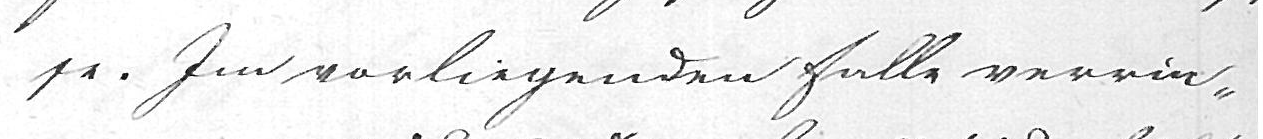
se. In vorliegenden Falle verrin-
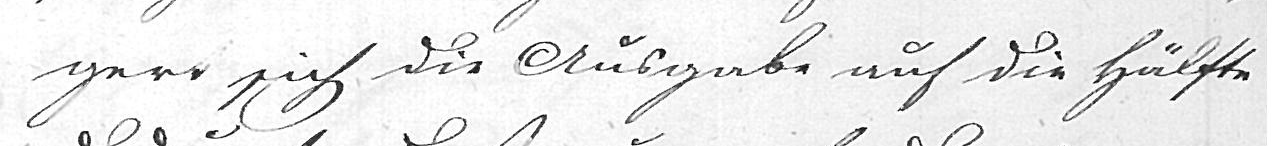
gert sich die Ausgabe auf die Hälfte
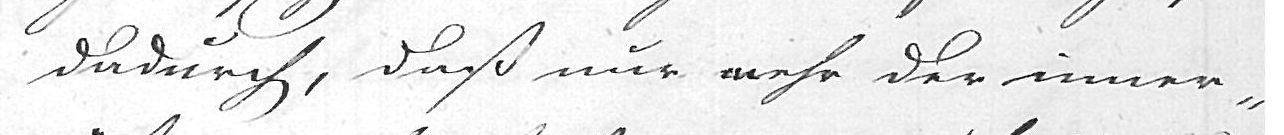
dadurch, daß nur mehr der inner-
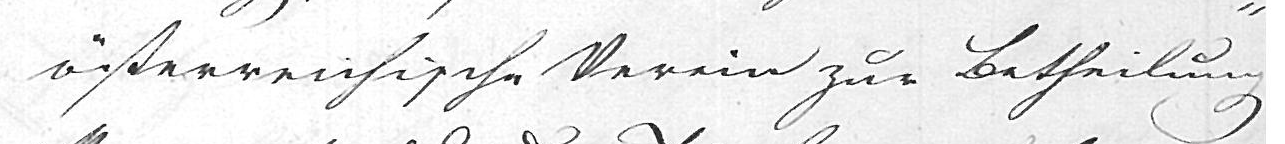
österreichische Verein zur Betheiltung
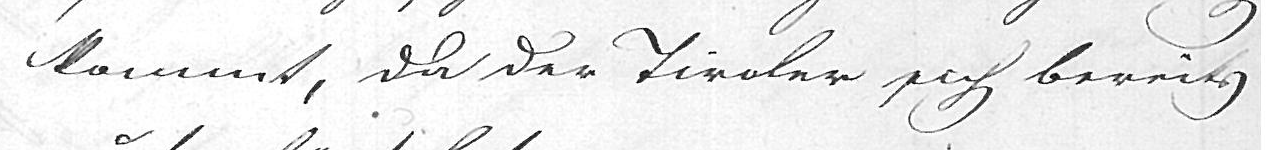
kommt, da der Tiroler sich bereits
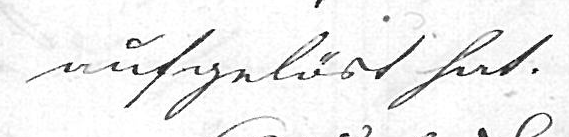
aufgelöst hat.
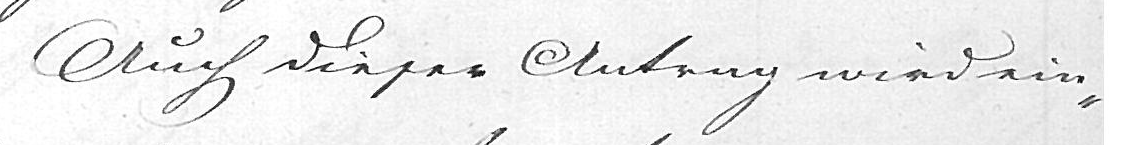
Auch dieser Antrag wird ein-
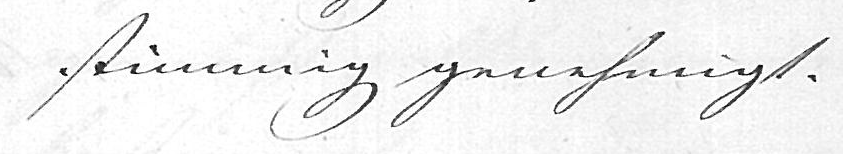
stimmig genehmigt.
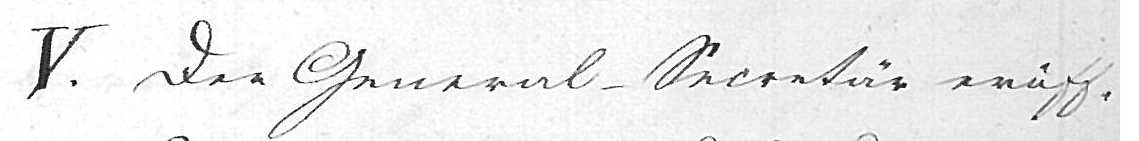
V. Der General-Secretär eröff-
